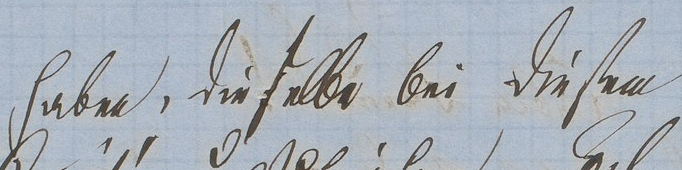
haben, dieselbe bei diesem
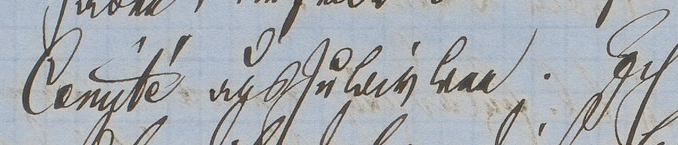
Comité auszuwirken. Ich
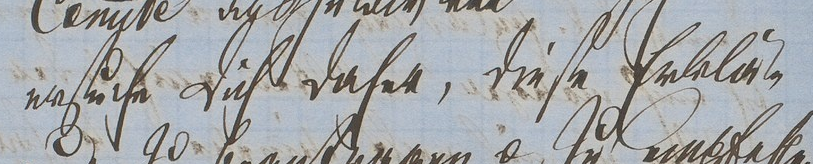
ersuche Dich daher, diese Erklä-
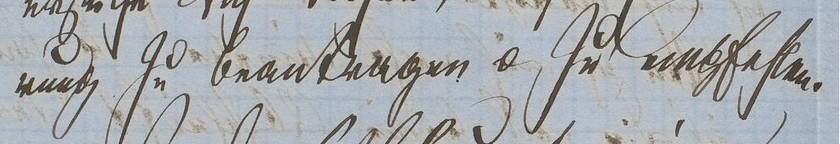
rung zu beantragen & zu empfehlen.
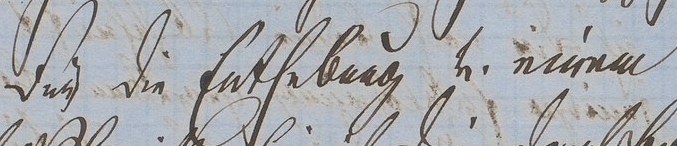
Für die Enthebung v. einem
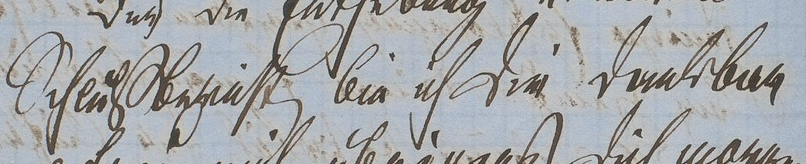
Schlußbericht bin ich Dir dankbar
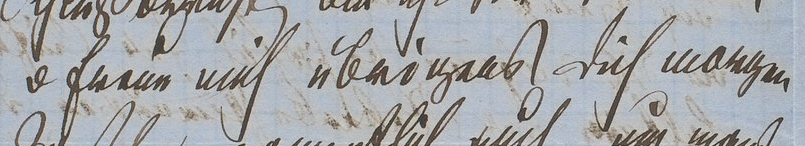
& freue mich übrigens Dich morgen
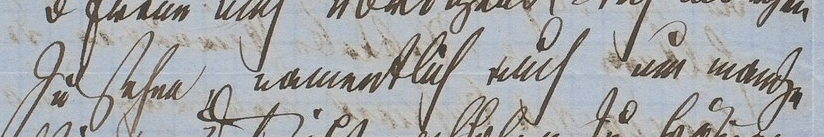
zu sehen, namentlich auch um manche
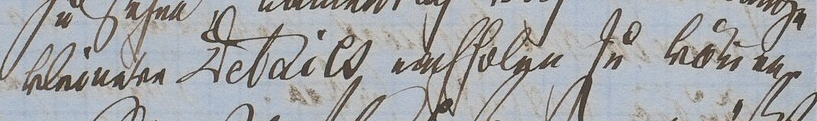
kleinere Details nachholen zu können.
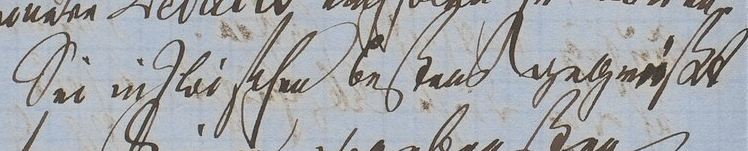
Sei inzwischen bestens gegrüßt
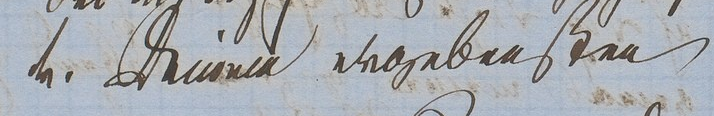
v. Deinem ergebensten
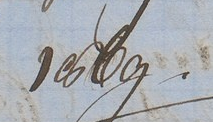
1869 .
